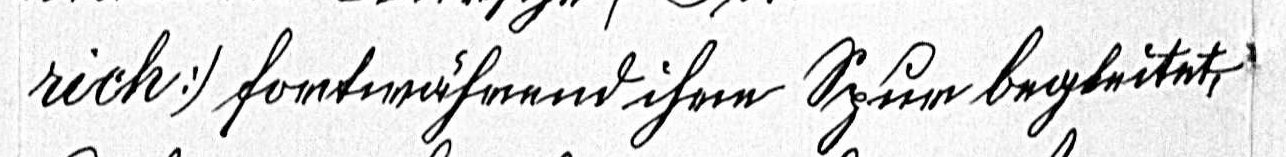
rich) fortwährend ihre Spur begleitet,
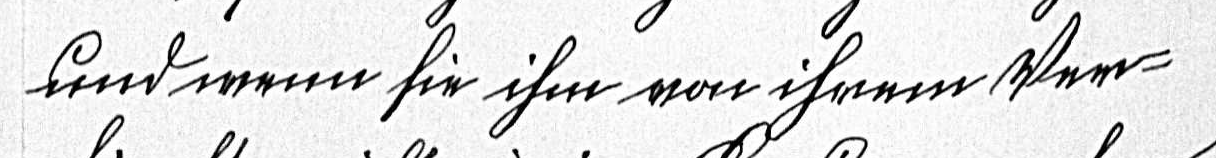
und wenn sie ihm von ihrem Ver¬
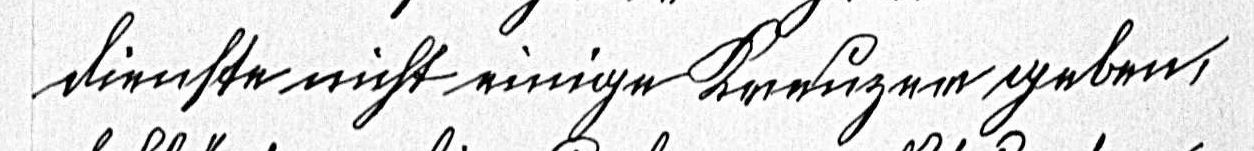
dienste nicht einige Kreuzer geben,
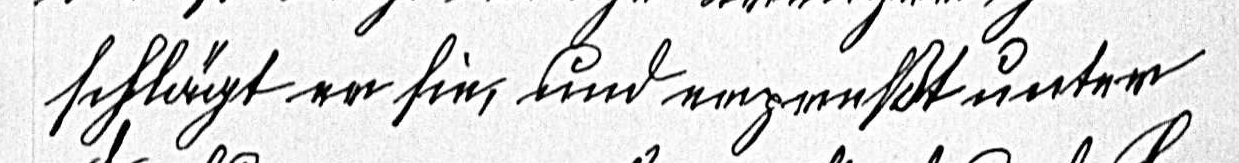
schlägt er sie, und erpreßt unter
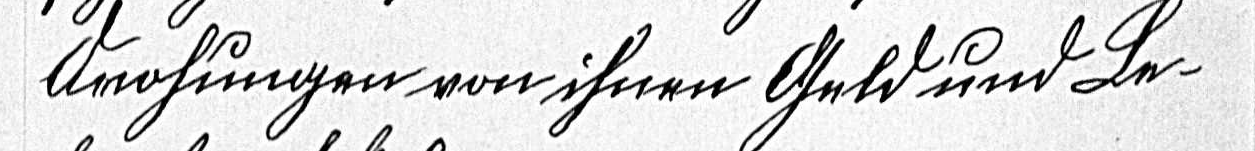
Drohungen von ihnen Geld und Le¬
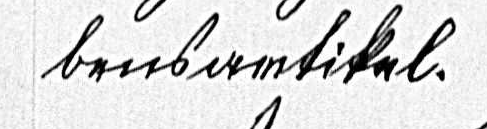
bensartikel.
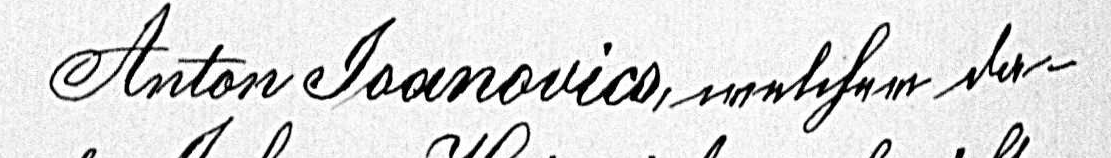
Anton Ioanovics, welcher da¬
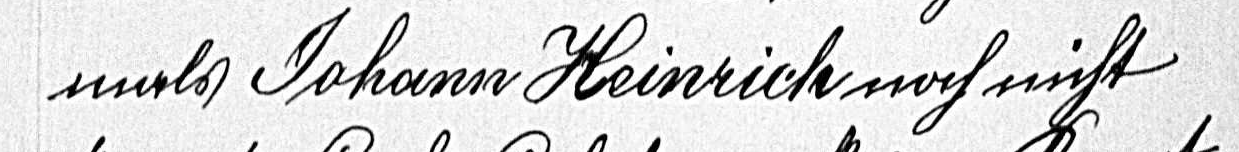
mals Johann Heinrich noch nicht
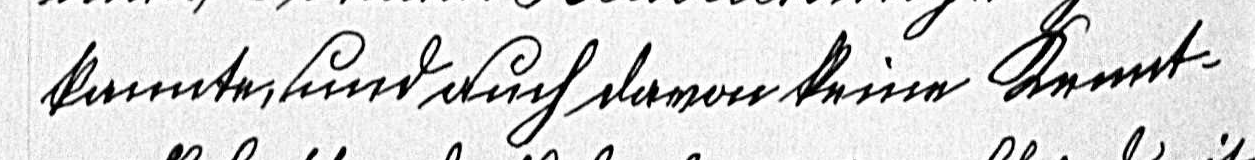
kannte, und auch davon keine Kennt¬
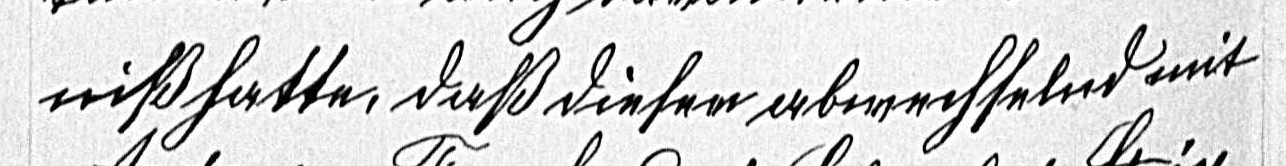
niß hatte, daß dieser abwechselnd mit
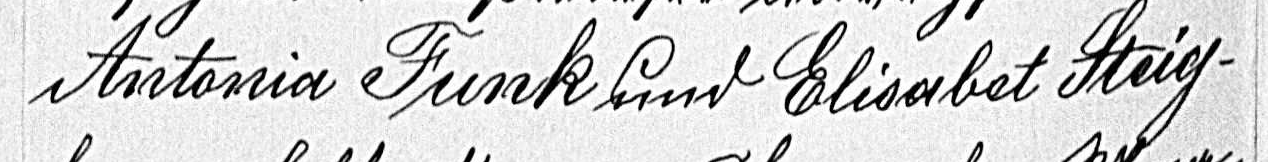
Antonia Funk und Elisabet Steig¬
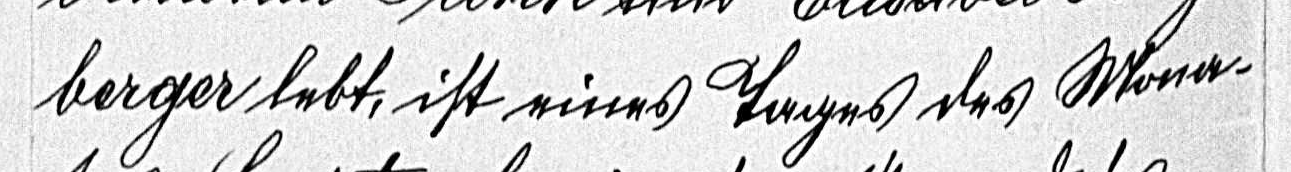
berger lebt, ist eines Tages des Mona¬
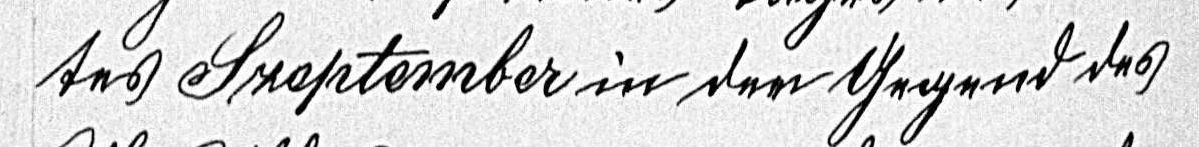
tes Szeptember in der Gegend des
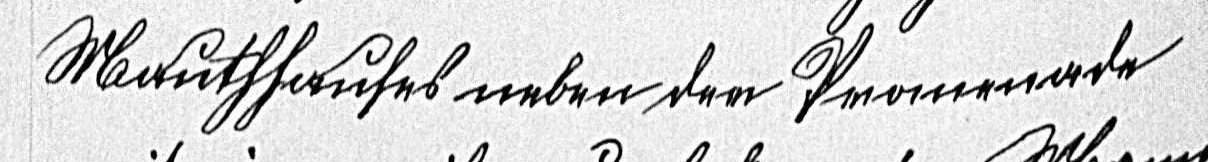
Mauthhauses neben der Promenade
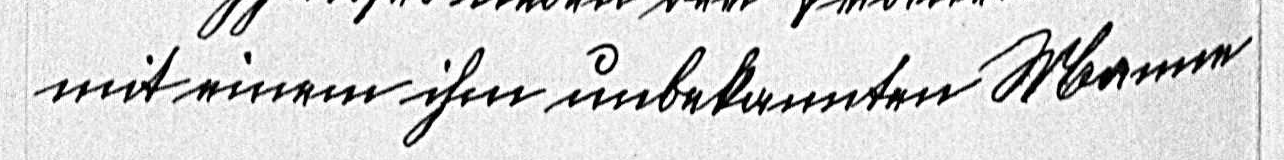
mit einem ihm unbekannten Manne
